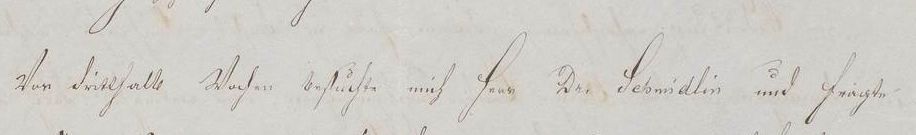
Vor dritthalb Wochen besuchte mich Herr Dr. Schmidlin und fragte
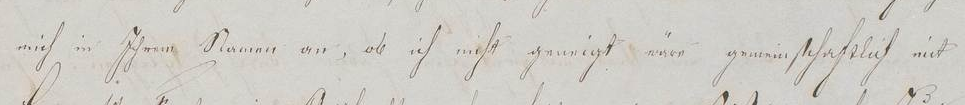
mich in Ihrem Namen an, ob ich nicht geneigt wäre gemeinschaftlich mit
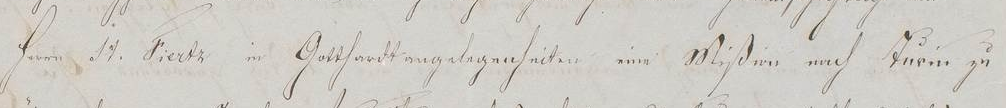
Herrn H. Fiertz in Gotthardtangelegenheiten eine Mißion nach Turin zu
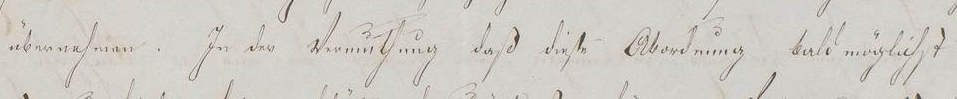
übernehmen. In der Vermuthung daß diese Abordnung bald möglichst
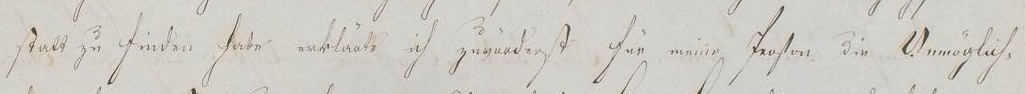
statt zu finden habe erklärte ich zuvörderst für meine Person die Unmöglich-
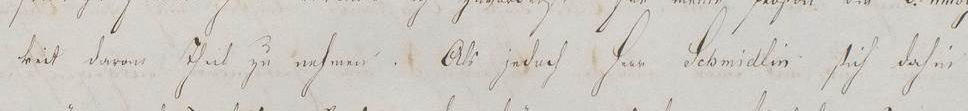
keit daran Theil zu nehmen. Als jedoch Herr Schmidlin sich dahin
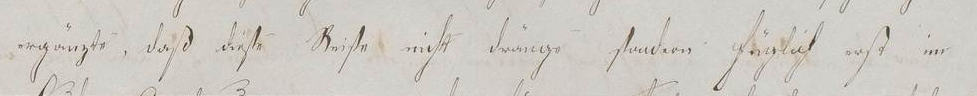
ergänzte, daß diese Reise nicht dränge sondern füglich erst im
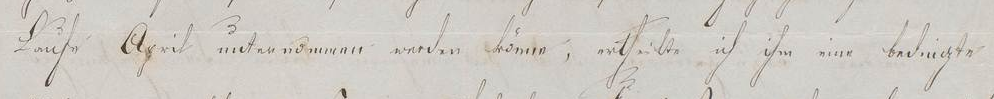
Laufe April unternommen werden könne, ertheilte ich ihm eine bedingte
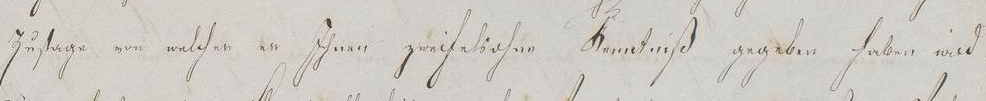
Zusage von welcher er Ihnen zweifelsohne Kenntniß gegeben haben wird.
